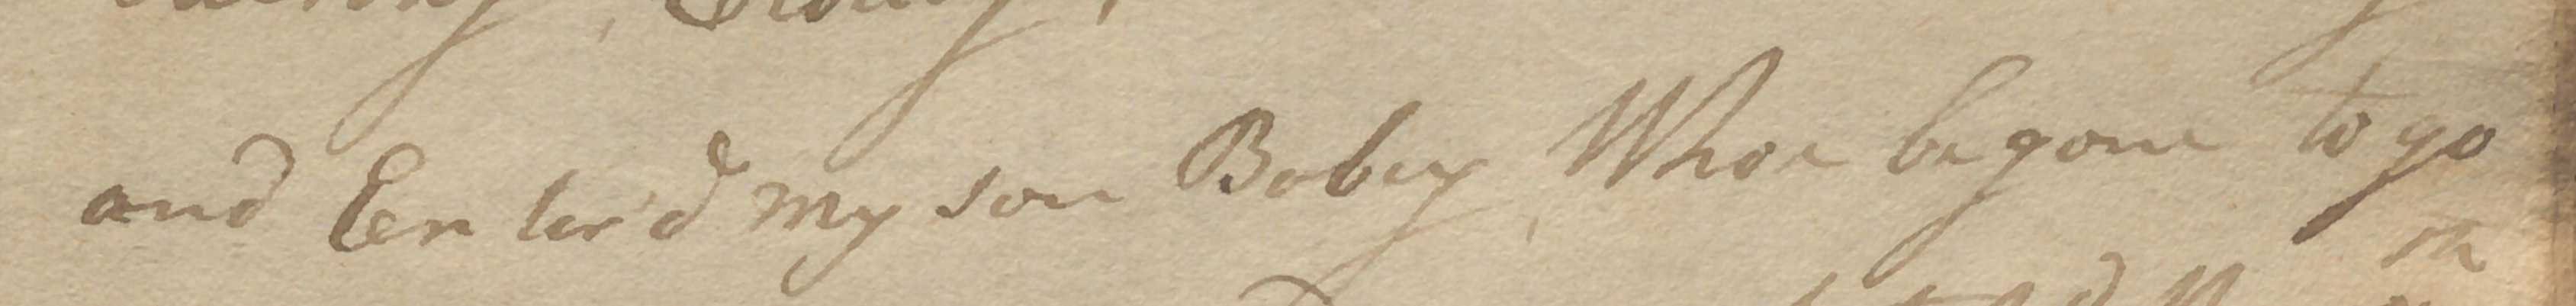and Enter'd my son Bobey Whoe bigon to go
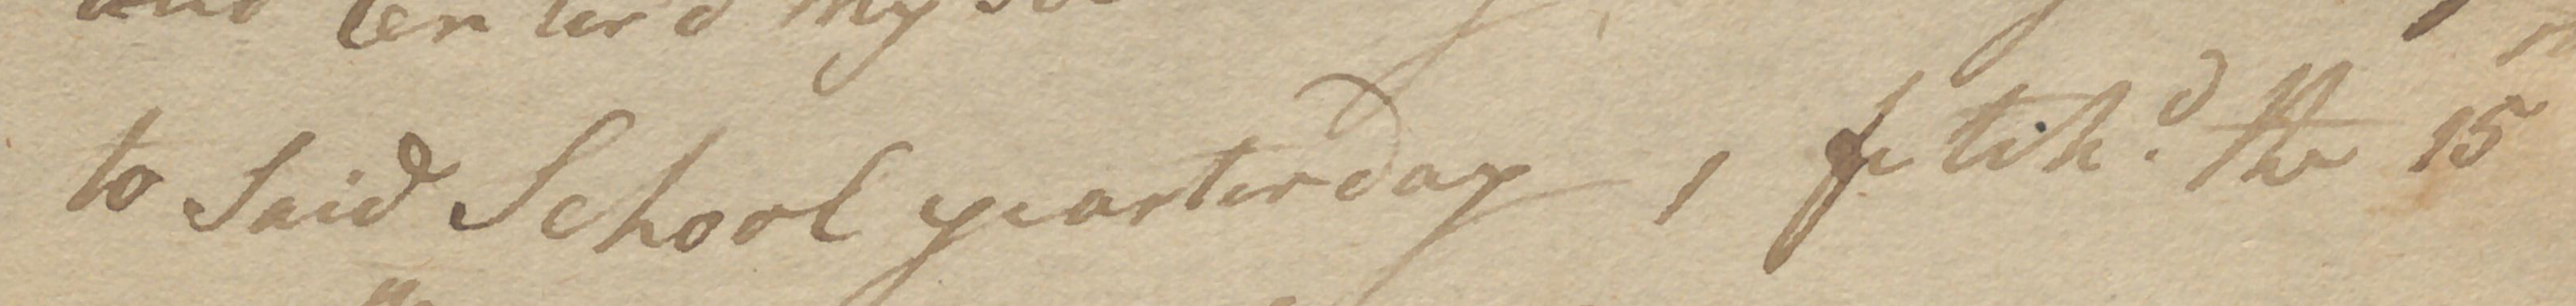to Said School yearterday , fetch^d. the 15^th
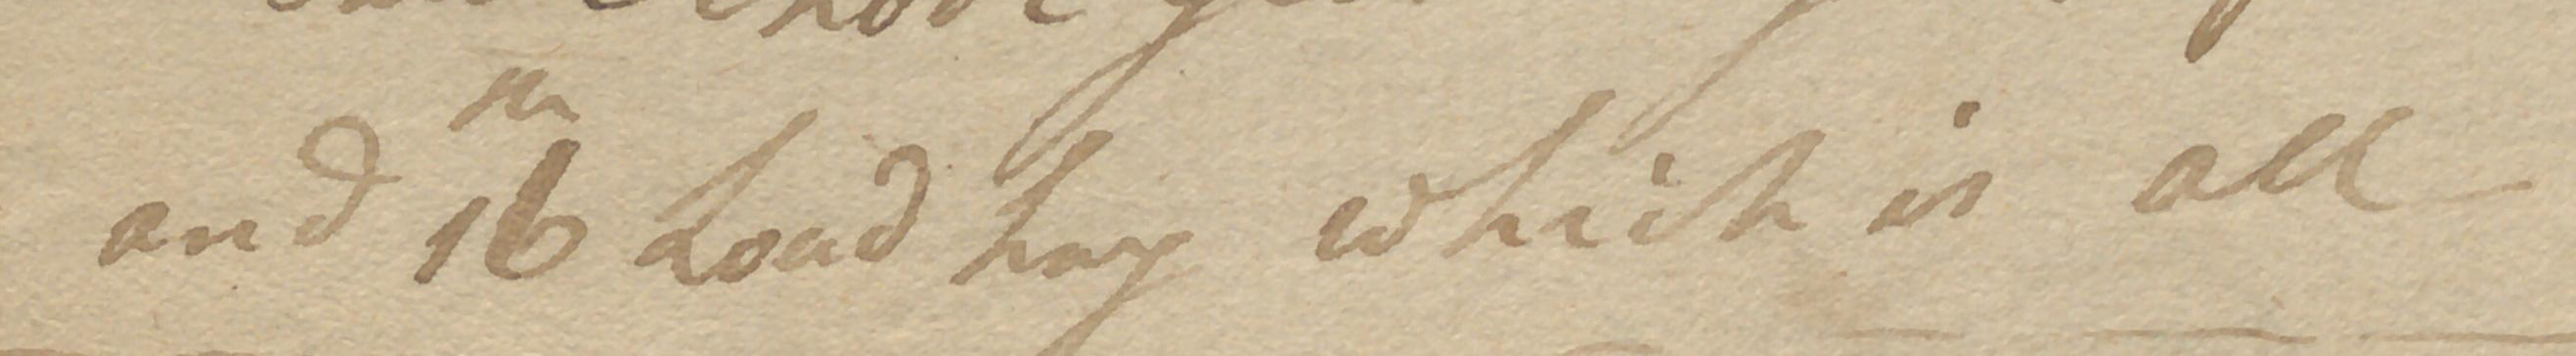and 16^th Load hay which is all
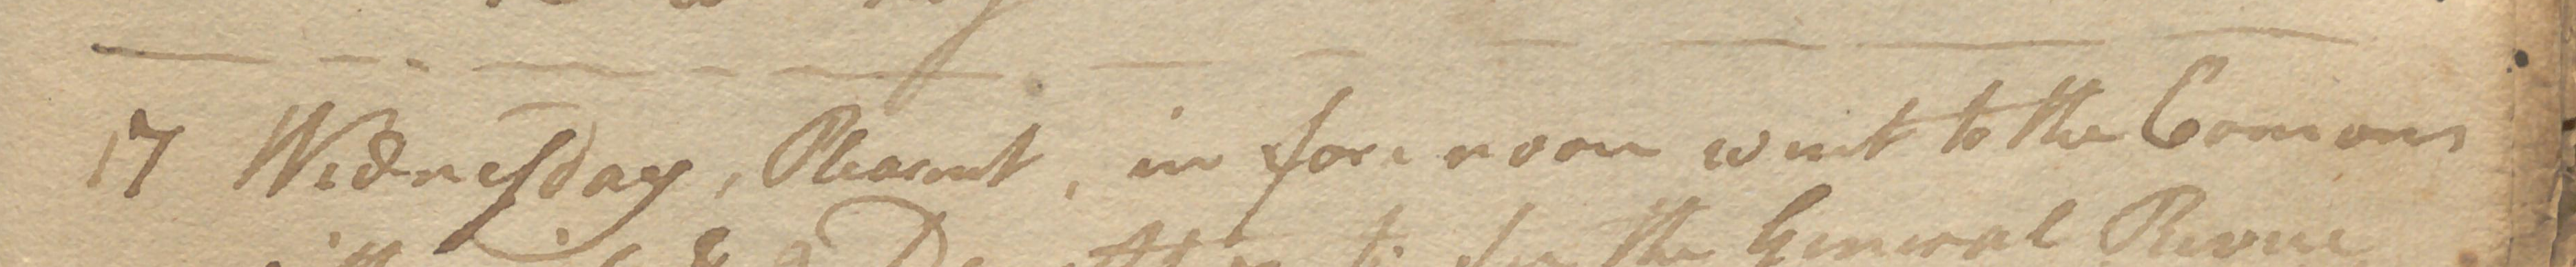17 Wednesday, Pleasent, in fore noon went to the Comons
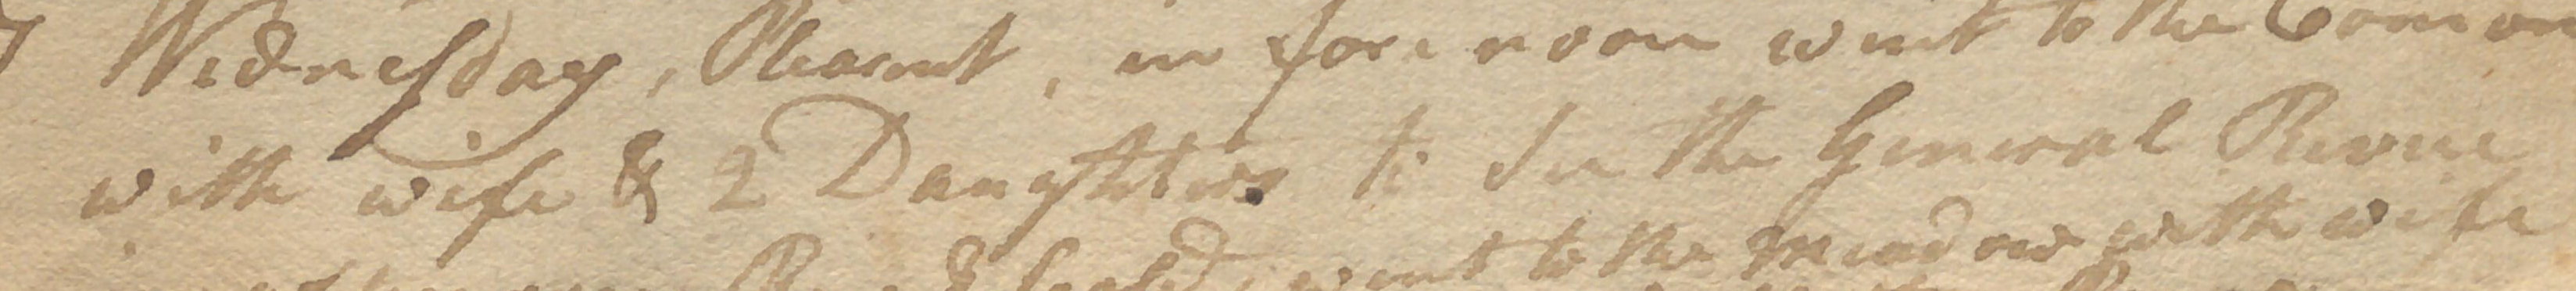with wife & 2 Daughters to see the General Revue
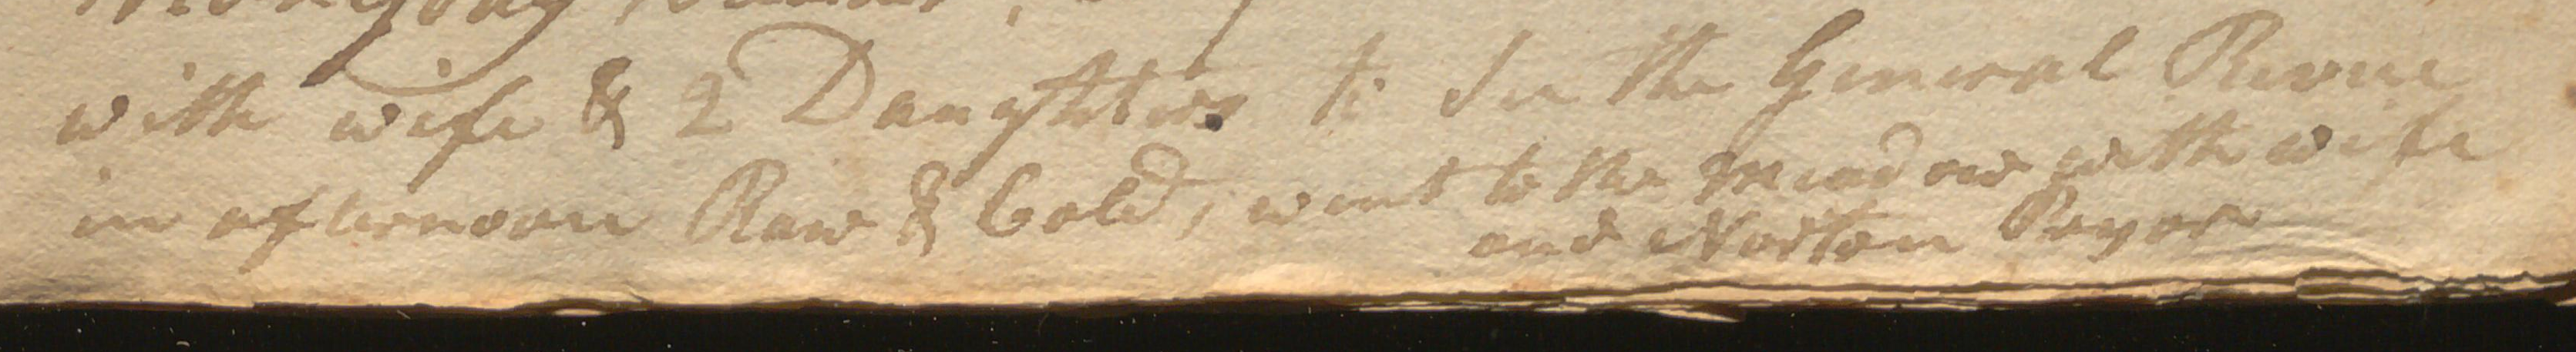in afternoon Raw & Cold, went to the meadow with wife
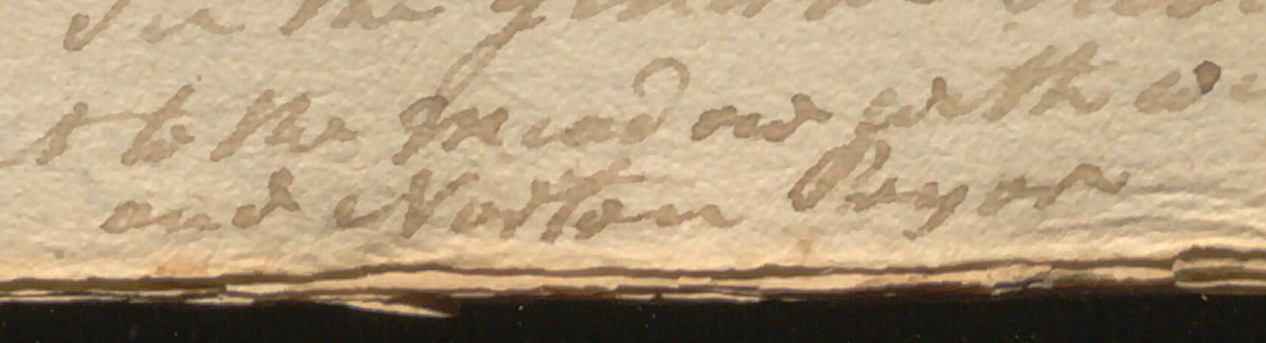and Norton Pryor
